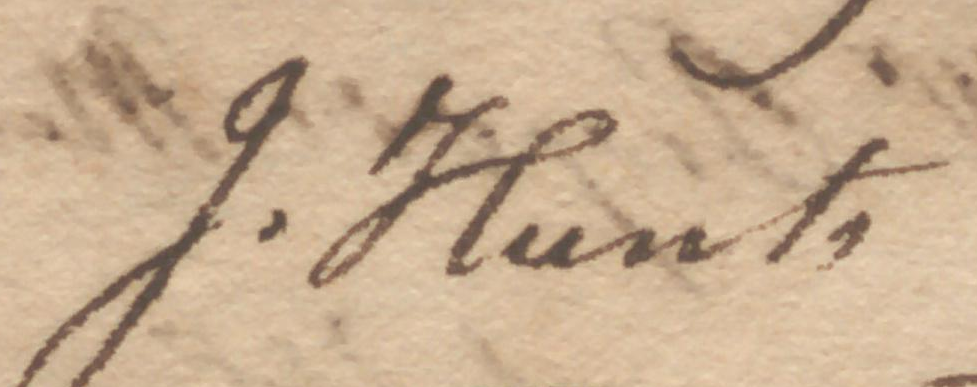J. Hunts
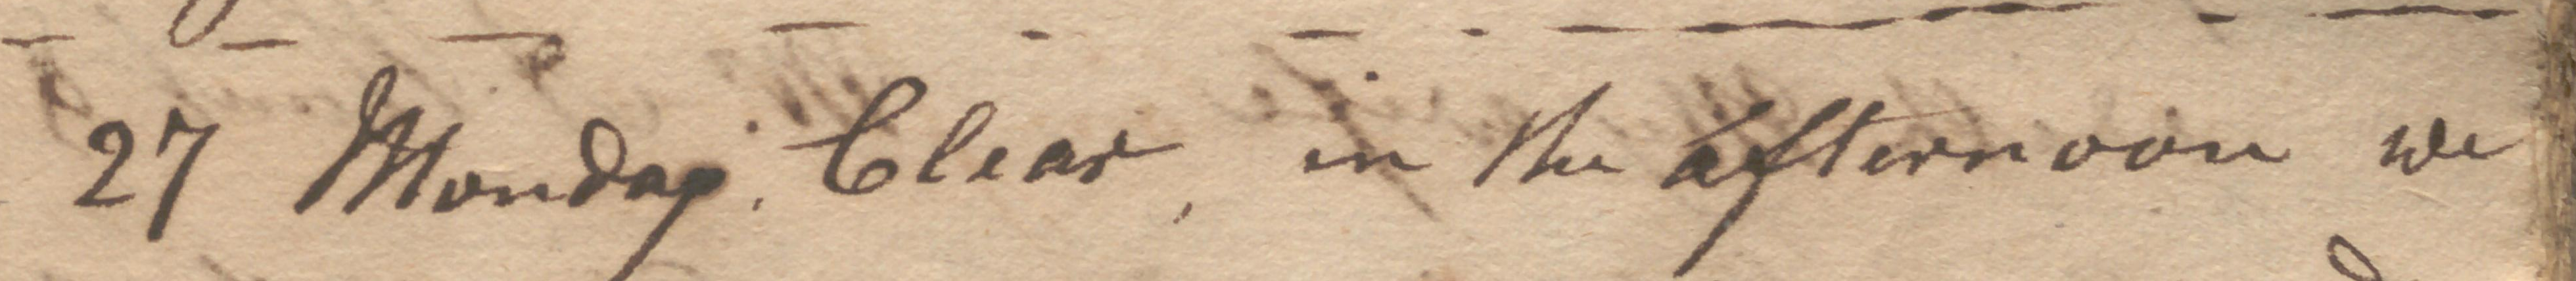27 Monday Clear in the afternoon we
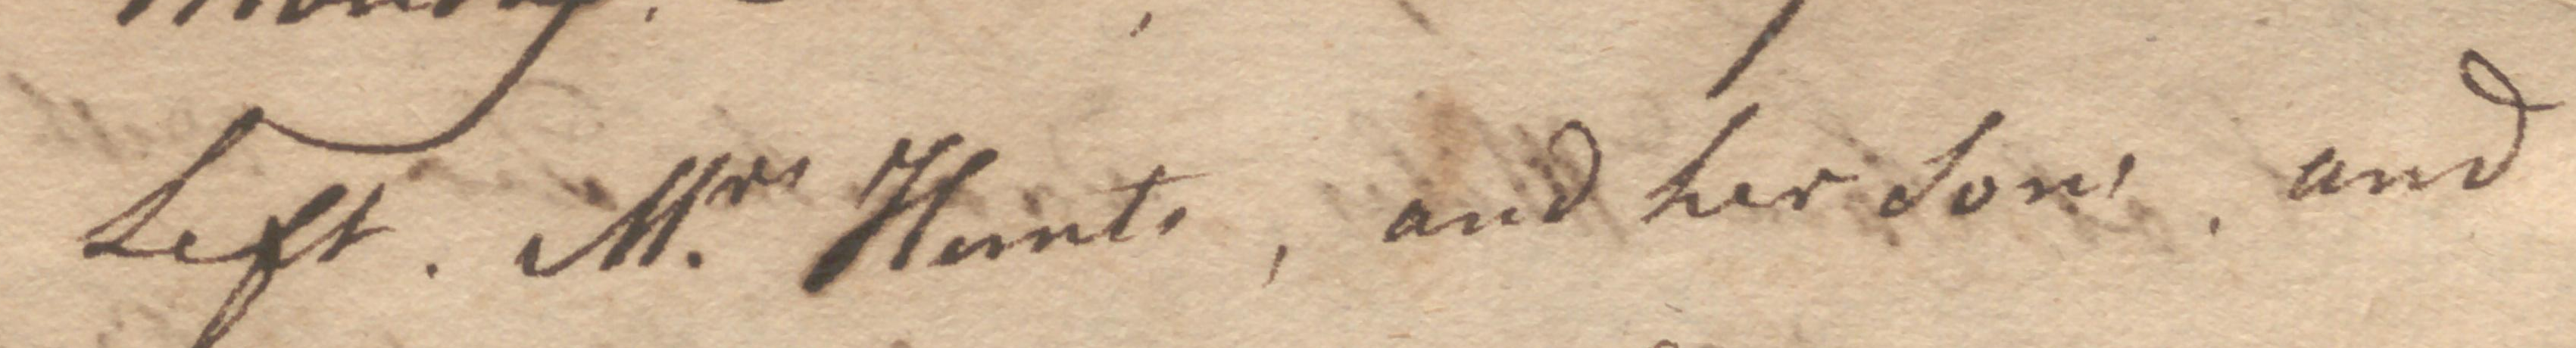Left. M^r. Hunts, and her sons, and
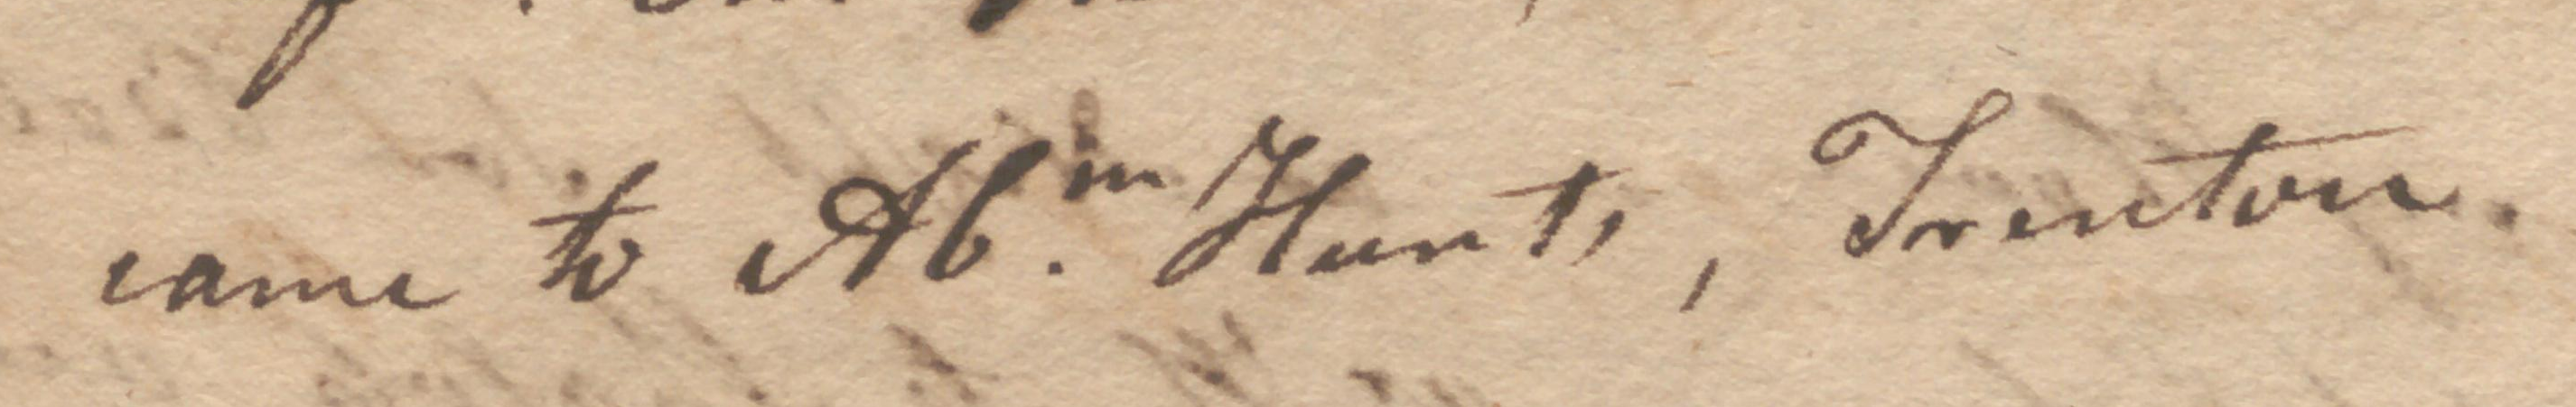came to Ab^m. Hunts, Trenton
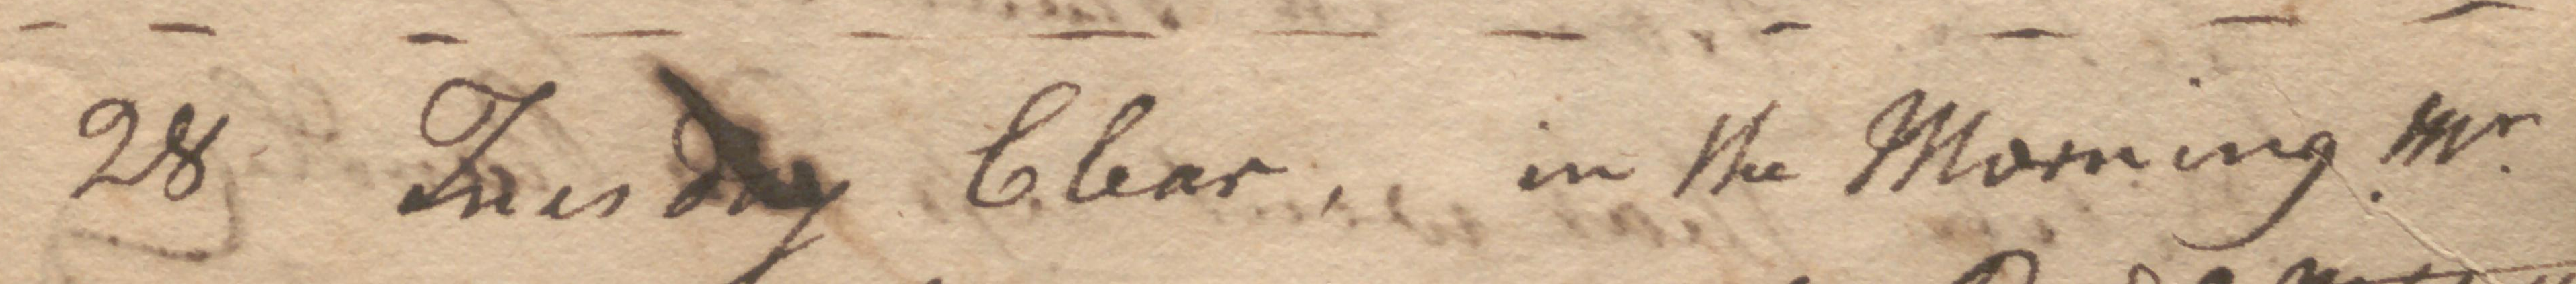28. Tuesday Clear, in the Moming M^r.
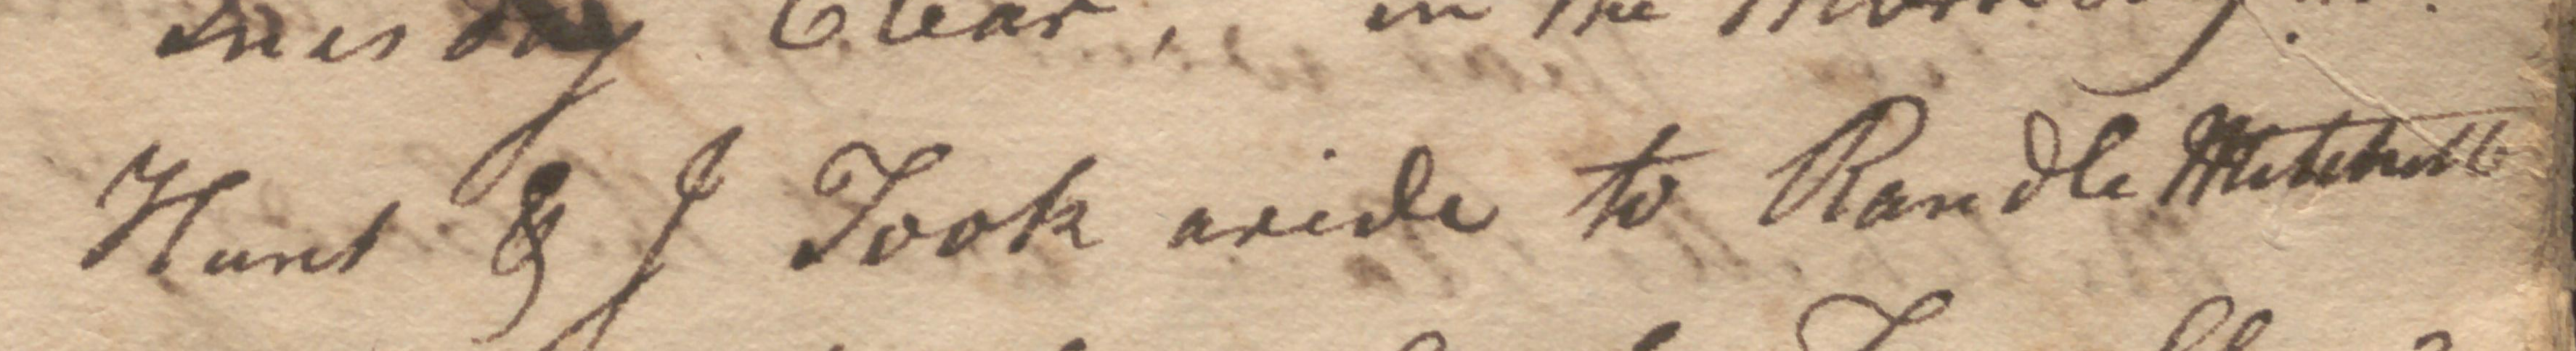Hunt & I Took a ride to Randle Mitchell
